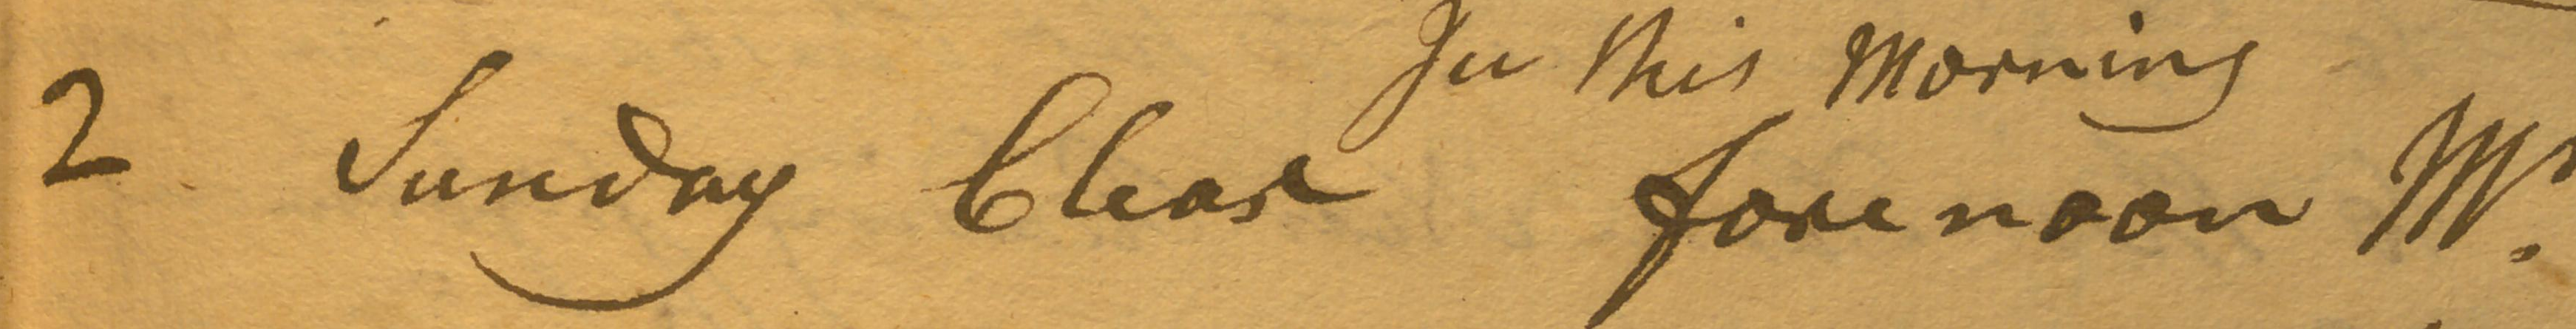2 Sunday Clear forenoon M^r.
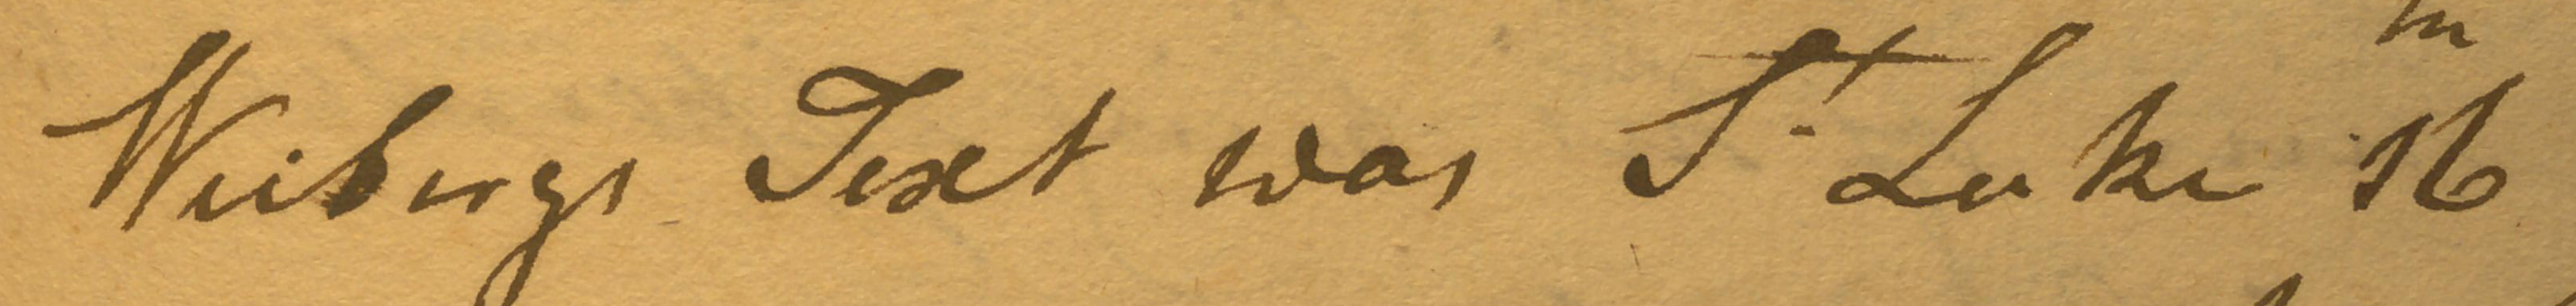Weibergs Text was S^t. Luke 16^th
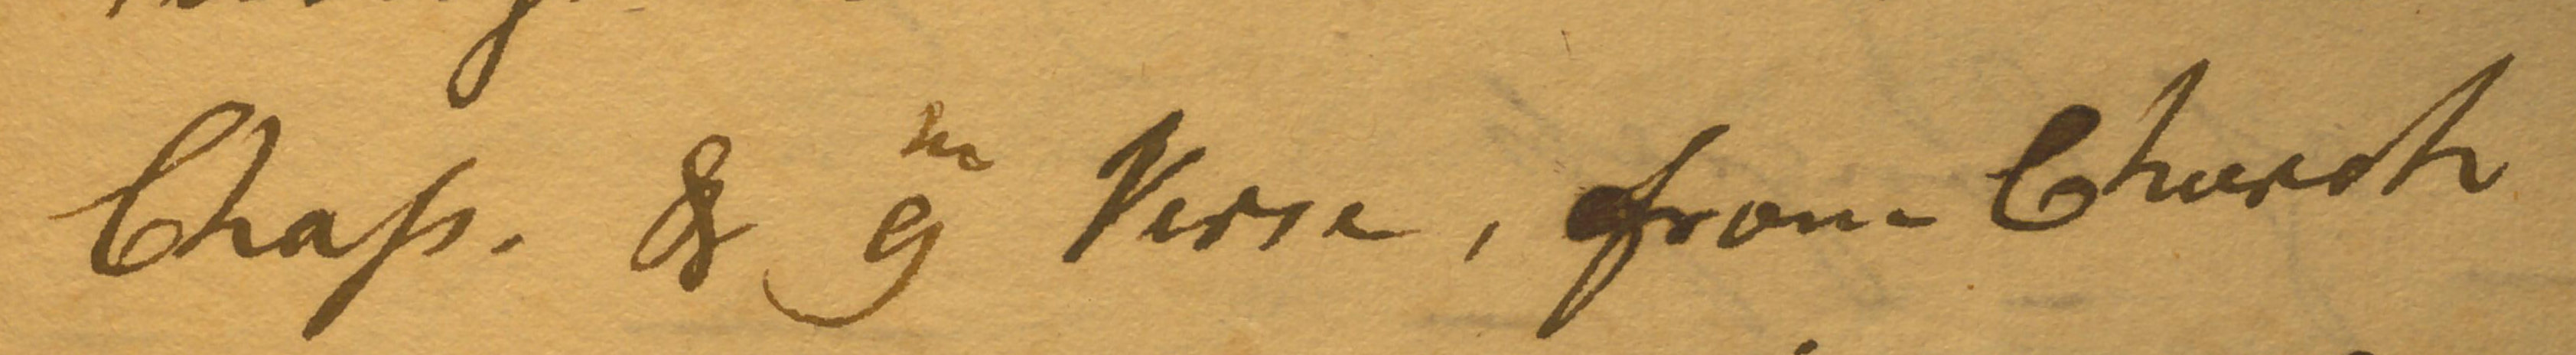Chap. & 9^th Verse, from Church
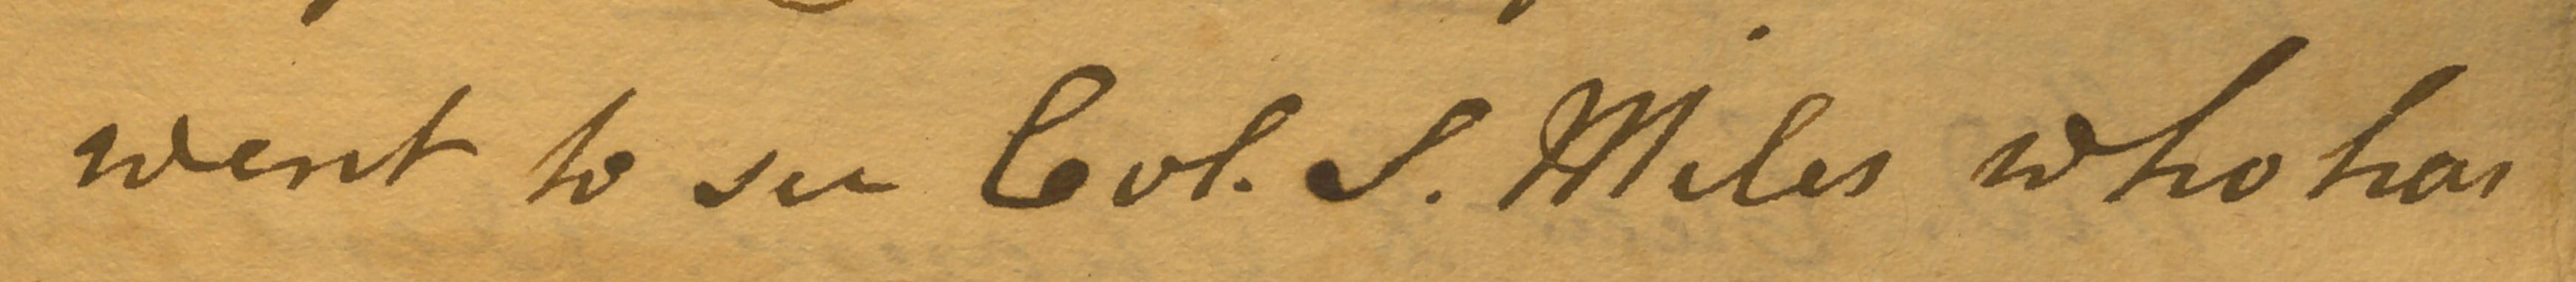went to see Col. S. Miles who has
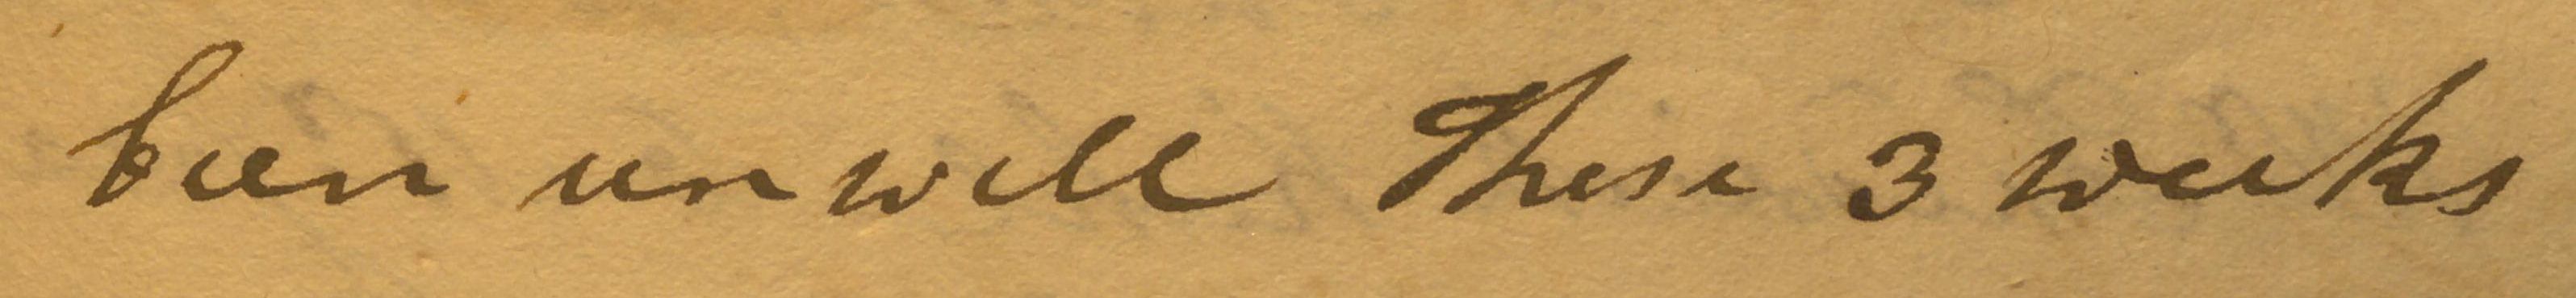been unwell These 3 weeks
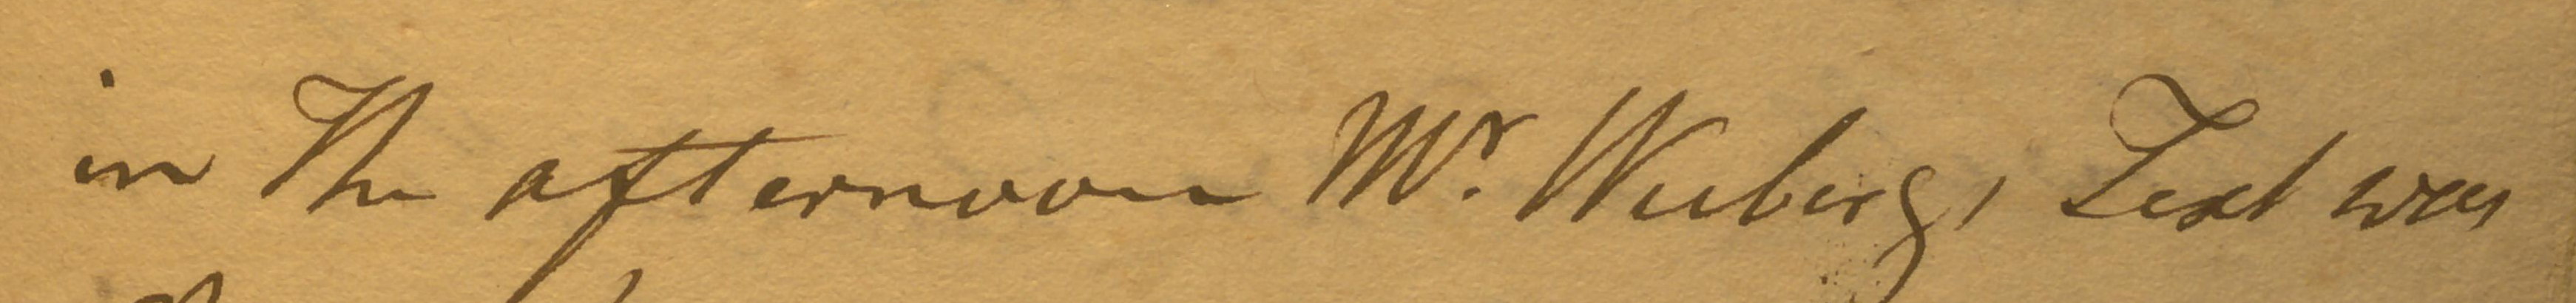in the afternoon M^r. Weibergs Text was
